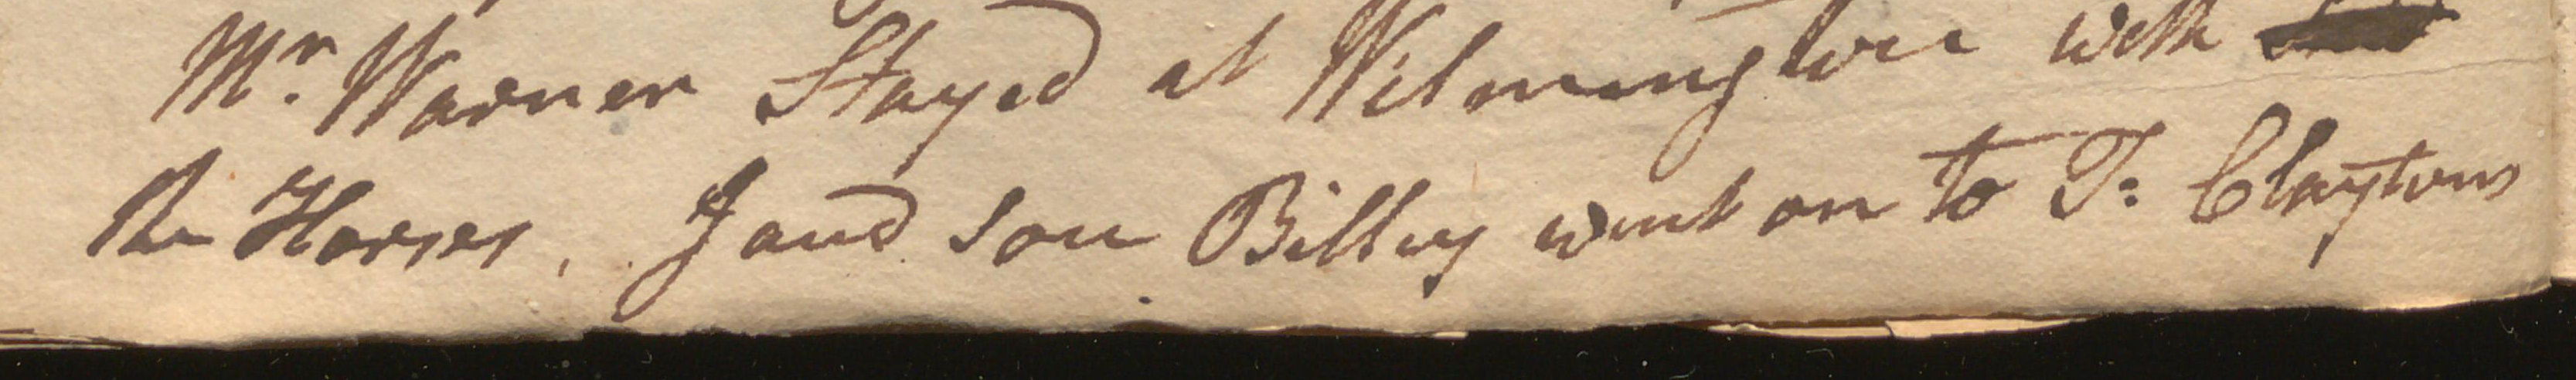the Horses. I and son Billey went on to T: Claytons
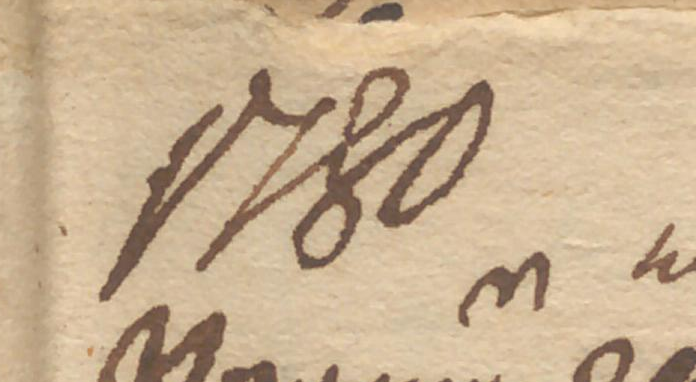1780
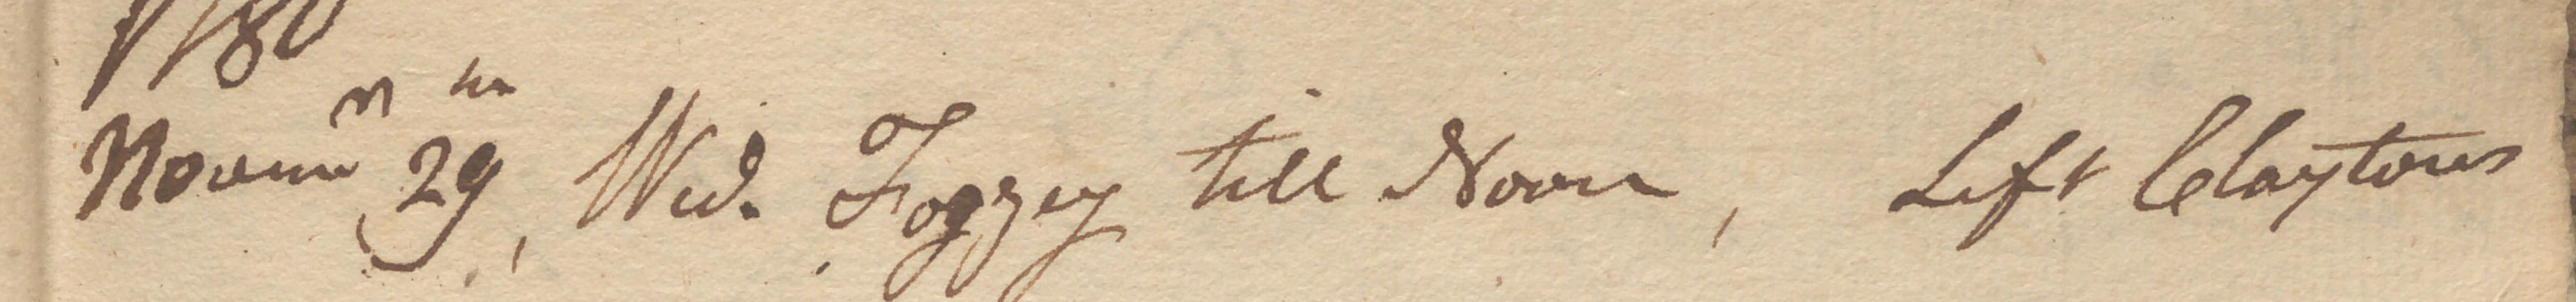Novem^r 29^th Wed. Foggey till Noon, Left Claytons
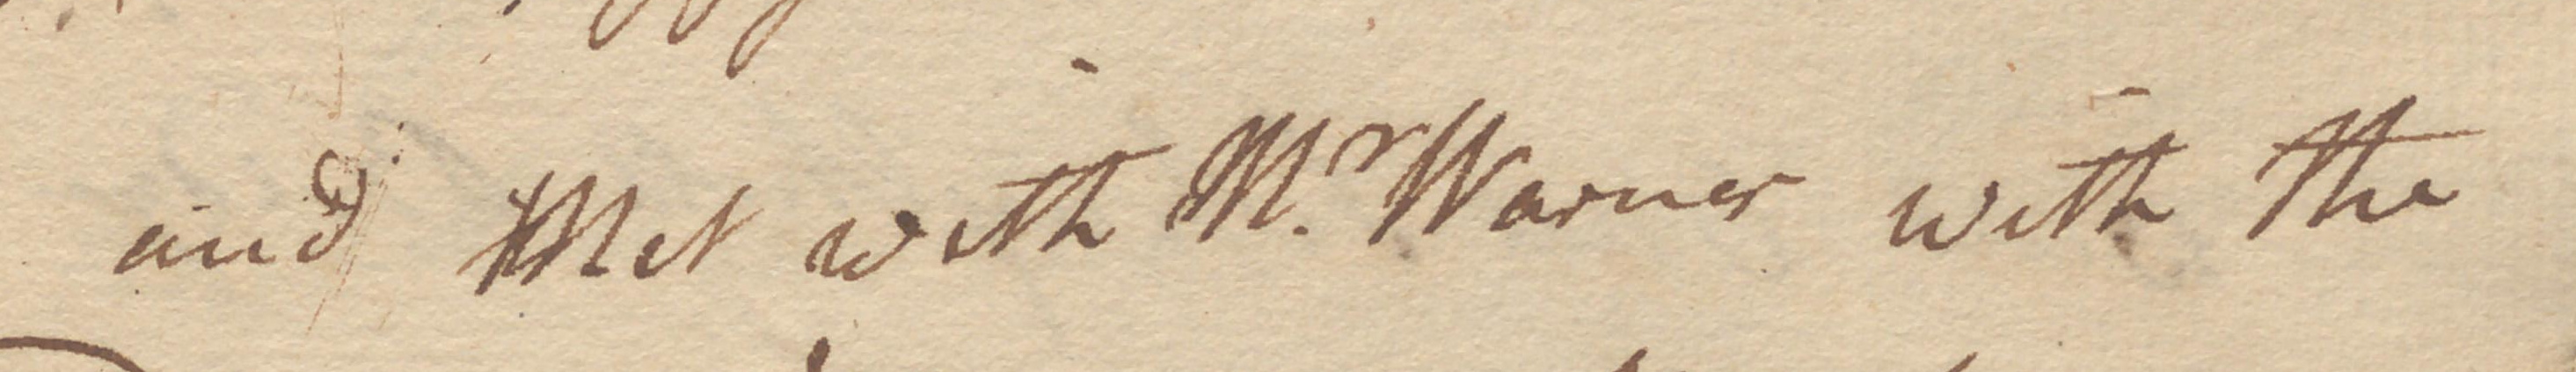and Met with M^r. Warner with the
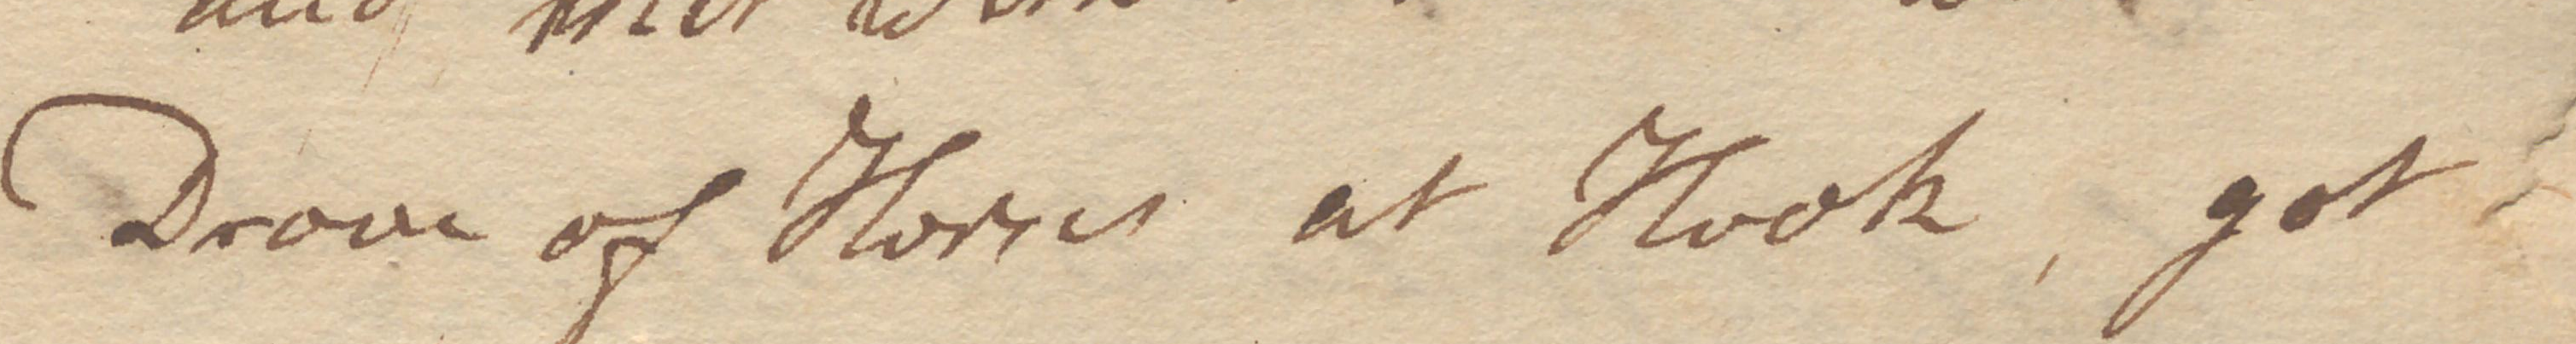Drove of Horses at Hook, got
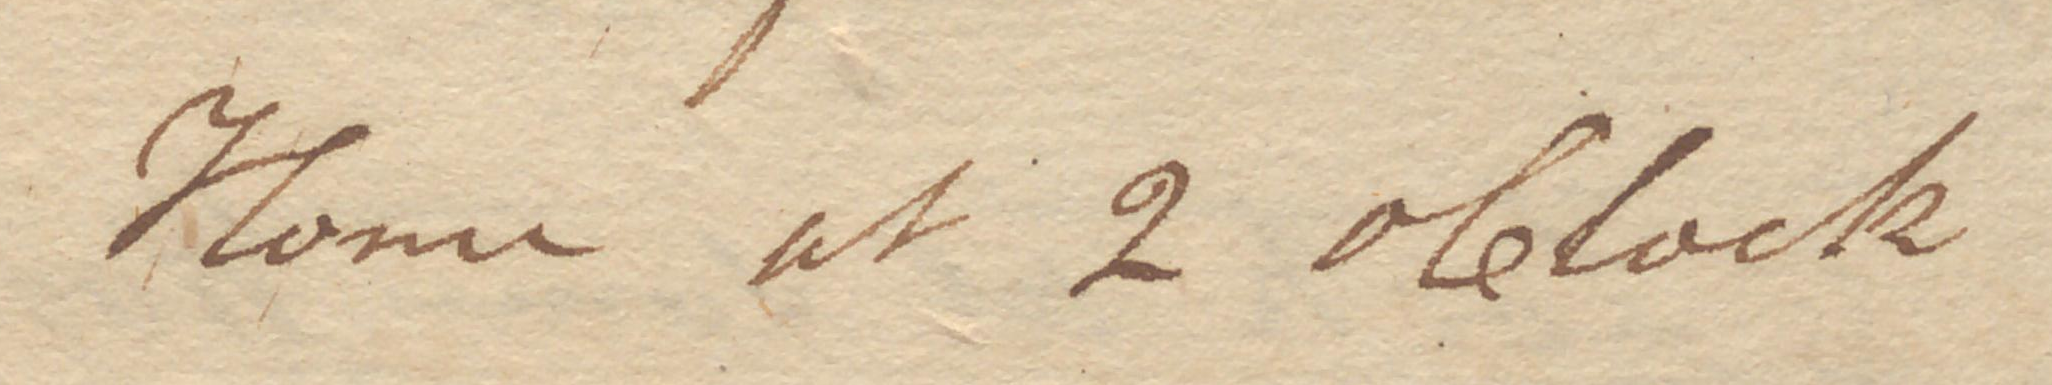Home at 2 oClock
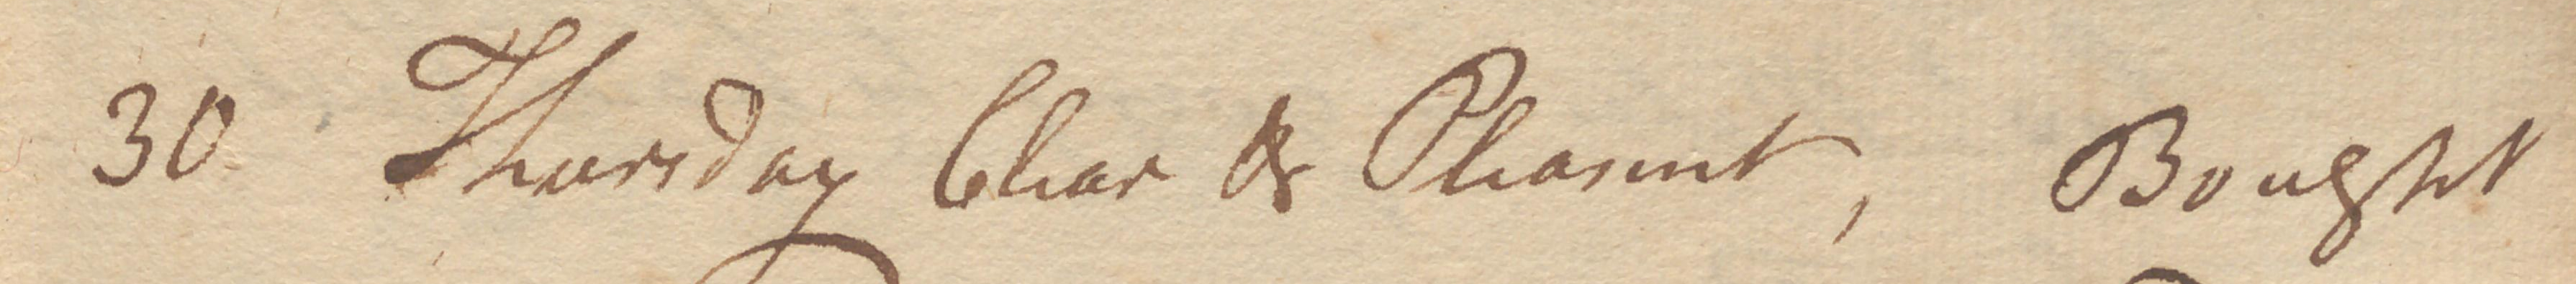30 Thursday Clear & Pleasent, Bought
